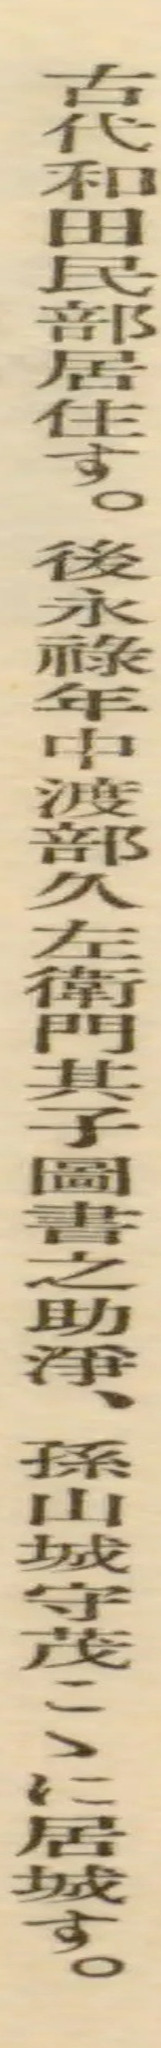古代和田民部居住す。後永禄年中渡部久左衛門其子図書之助浄、孫山城守茂こゝに居城す。
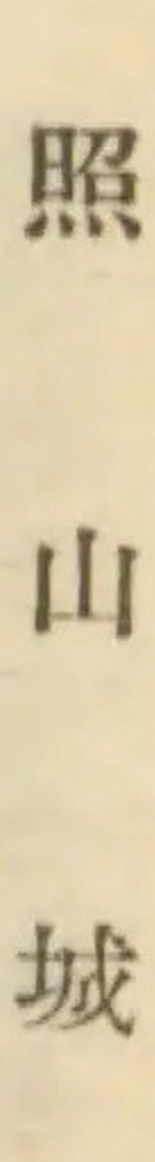照山城
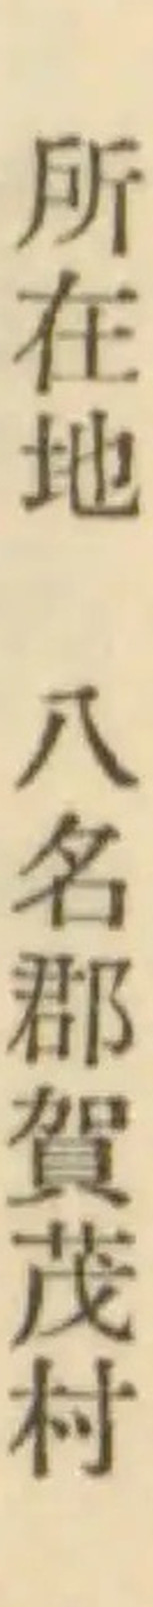所在地八名郡賀茂村
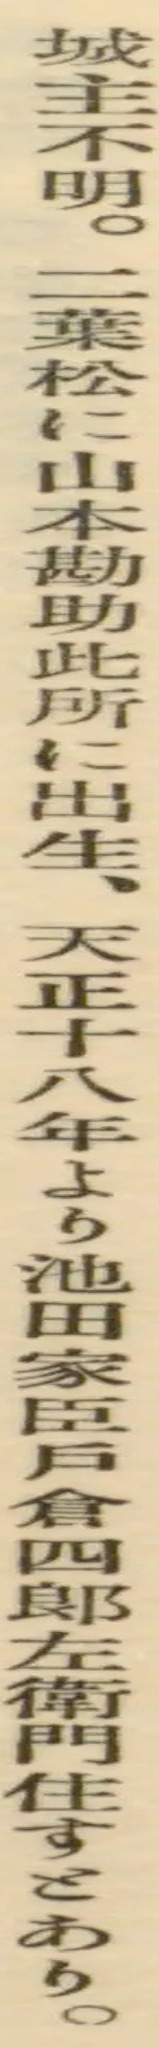城主不明。二葉松に山本勘介此所に出生、天正十八年より池田家臣戸倉四郎左衛門住すとあり。
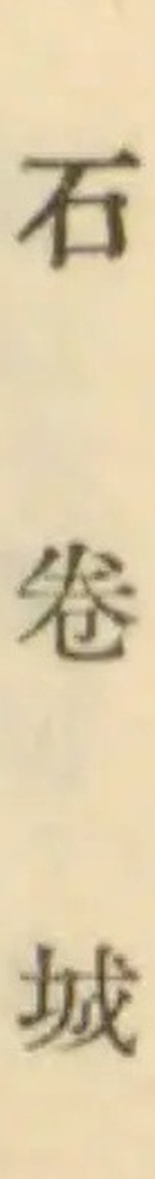石巻城
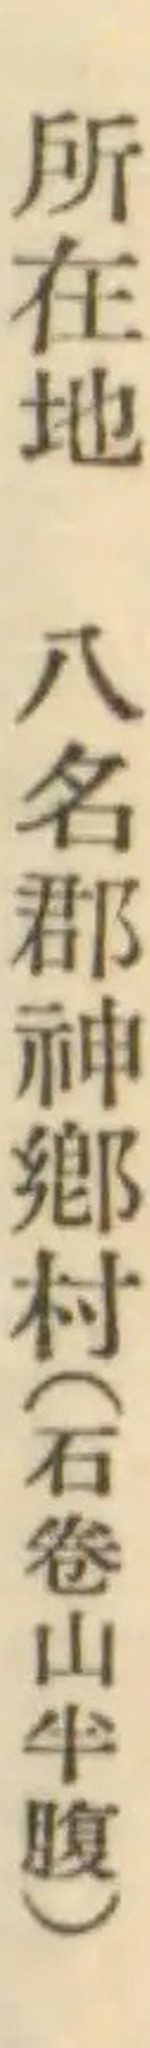所在地八名郡神郷村(石巻山半腹)
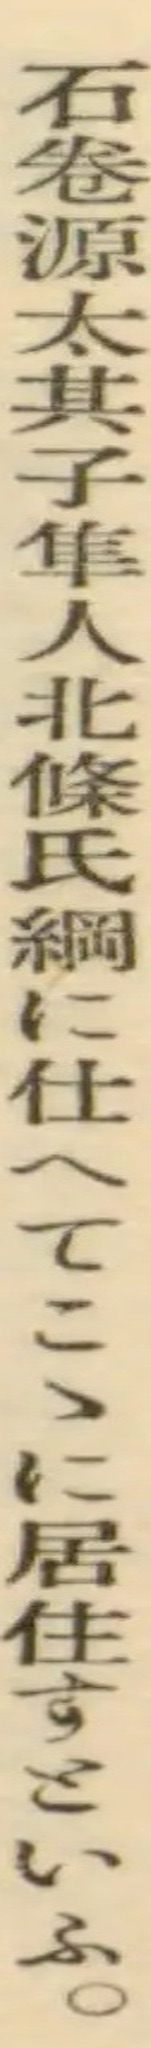石巻源太其子隼人北條氏綱に仕へてこゝに居住すといふ。
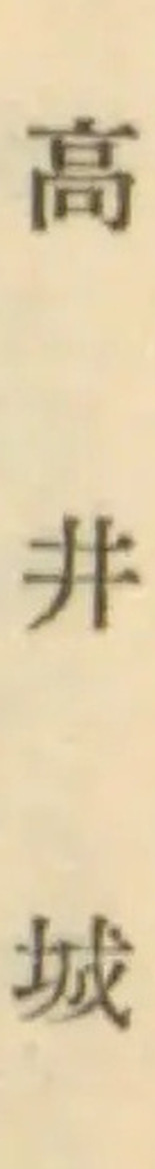高井城
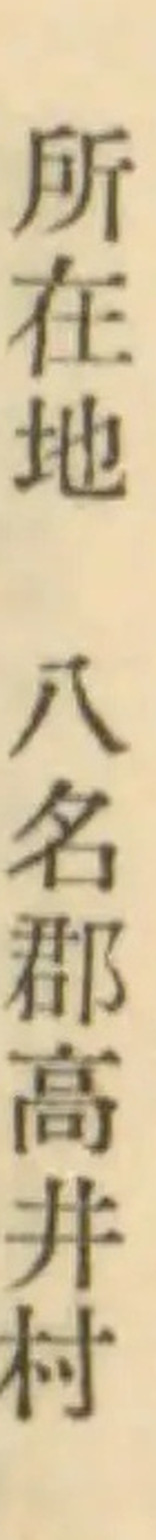所在地八名郡高井村

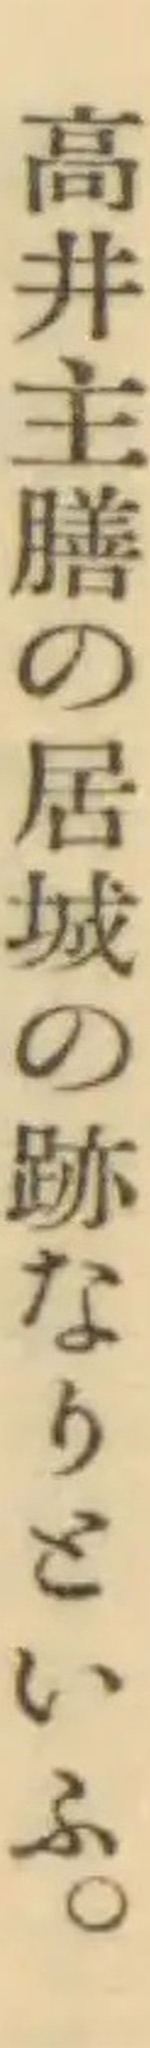高井主膳の居城の跡なりといふ。
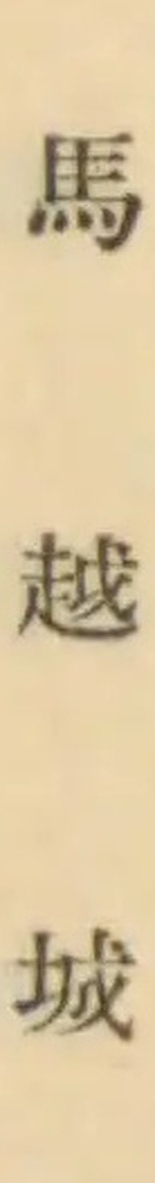馬越城
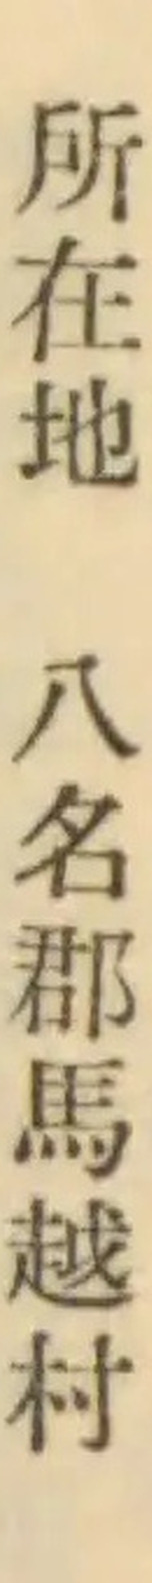所在地八名郡馬越村
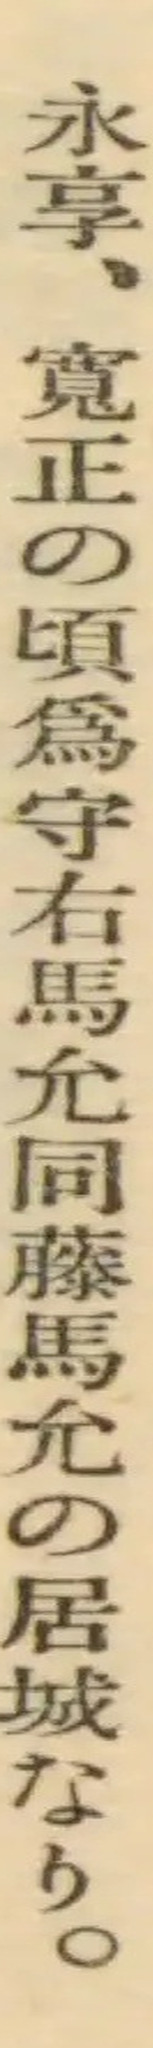永享、寛正の頃為守右馬允同藤馬允の居城なり。
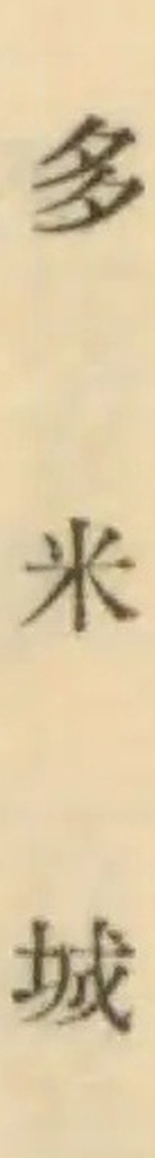多米城
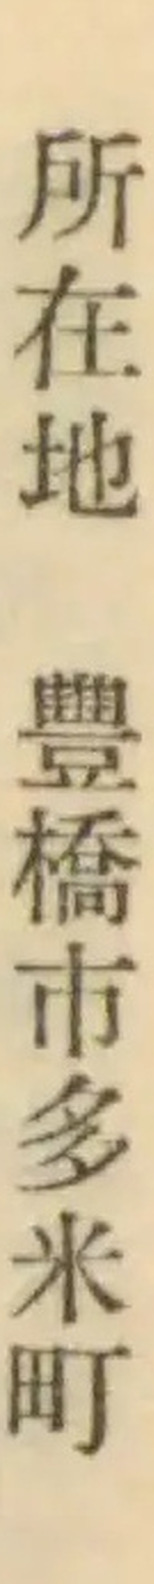所在地豊橋市多米町
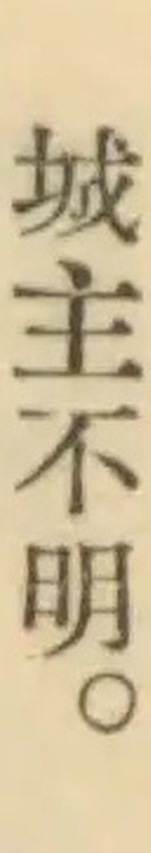城主不明。
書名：東三河之古城
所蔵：国立国会図書館 National Diet Library, JAPAN
